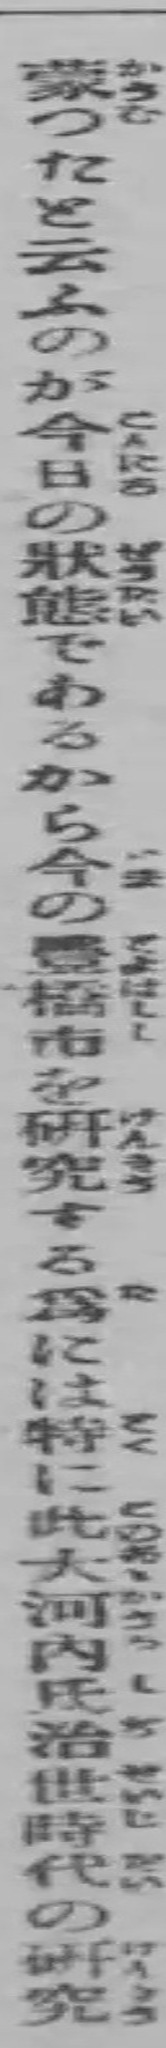蒙つたと云ふのが今日の状態あるから今の豊橋市を研究する為には特に此大河内氏治世時代の研究
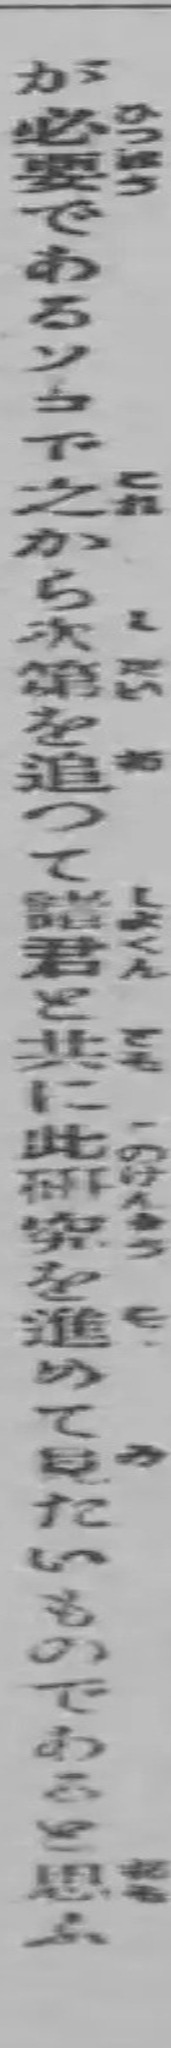が必要であるソコで之から次第を追つて諸君と共に此研究を進めて見たいものであると思ふ
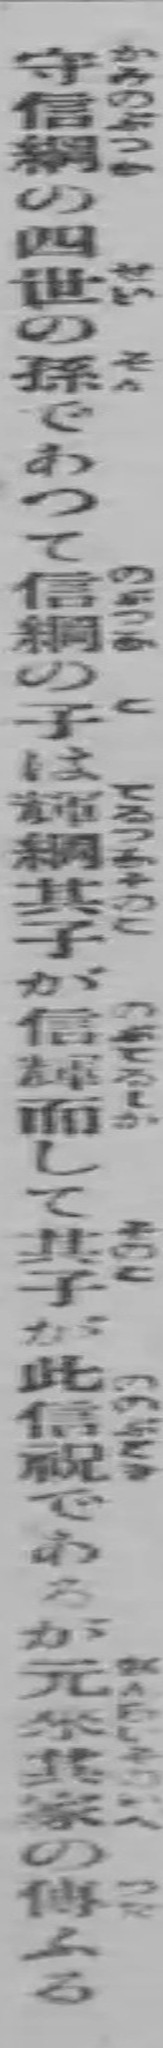守信綱の四世の孫であつて信綱の子は輝綱其子が信輝而して其子が此信祝であるが元来其家の伝ふる
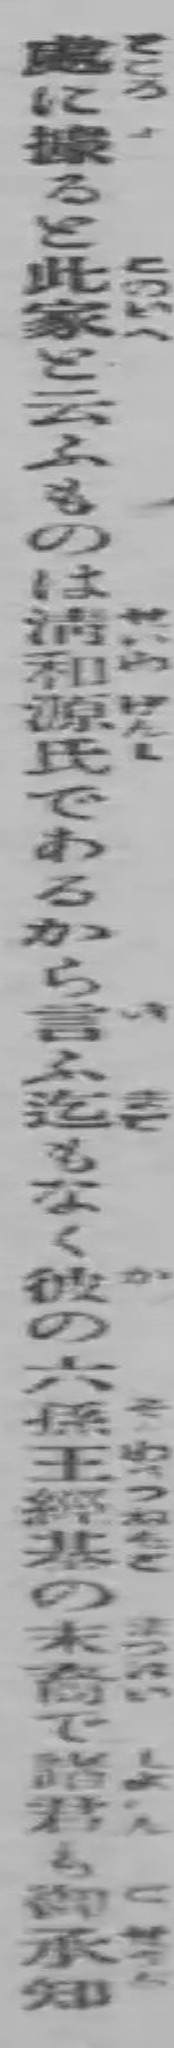処に拠ると此家と云ふものは清和源氏であるから言う迄もなく彼の六孫王経基の末裔で諸君も御承知
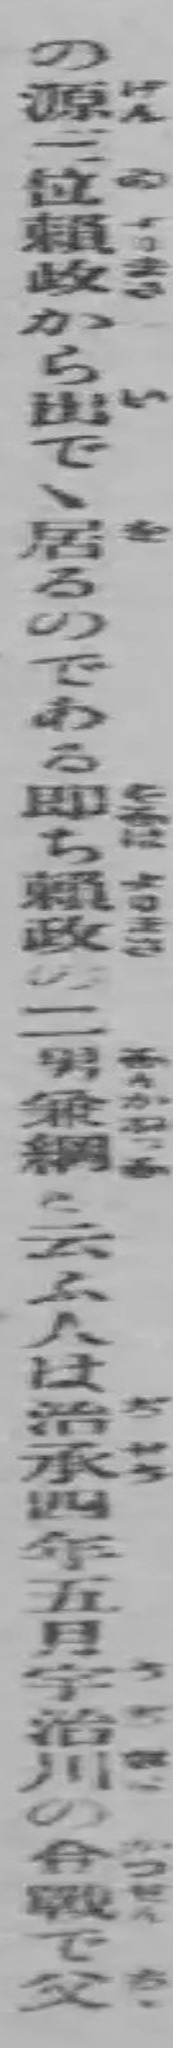の源一位頼政から出でゝ居るのである即ち頼政の二男兼綱と云ふ人は治承四年五月宇治川の合戦で父
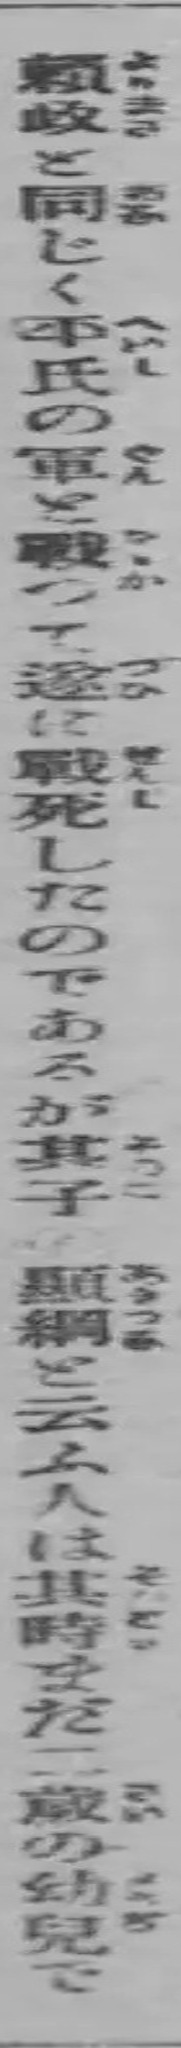大河内顕綱頼政と同じく平氏の軍と戦つて遂に戦死したのであるが其子の顕綱と云ふ人は其時まだ二歳の幼児で

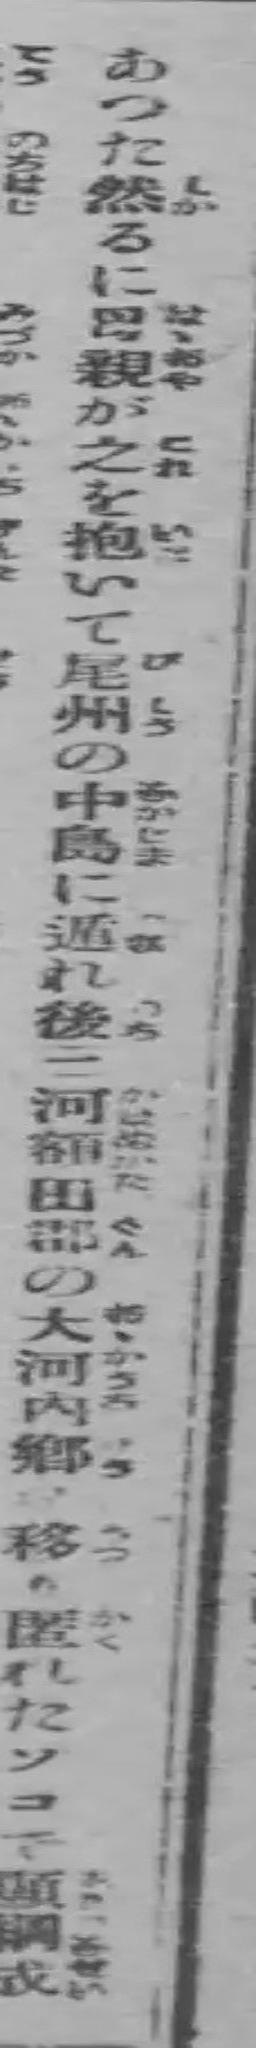あつた然るに母親が之を抱いて尾州の中島に遁れ後三河額田郡の大河内郷に移り匿れたソコで顕綱成
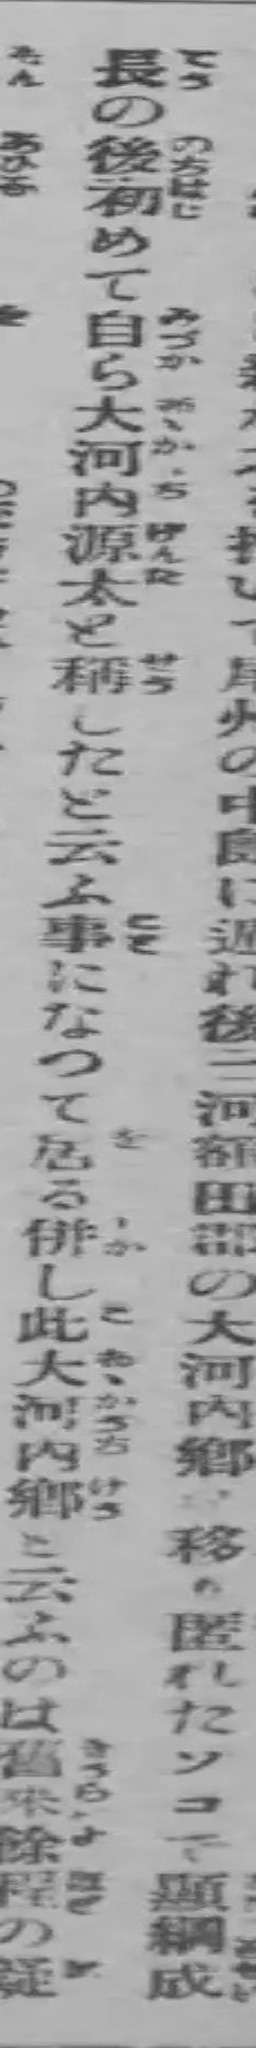大河内郷長の後初めて自ら大河内源太と称したと云ふ事になつて居る併し此大河内郷と云ふのは旧来余程の疑
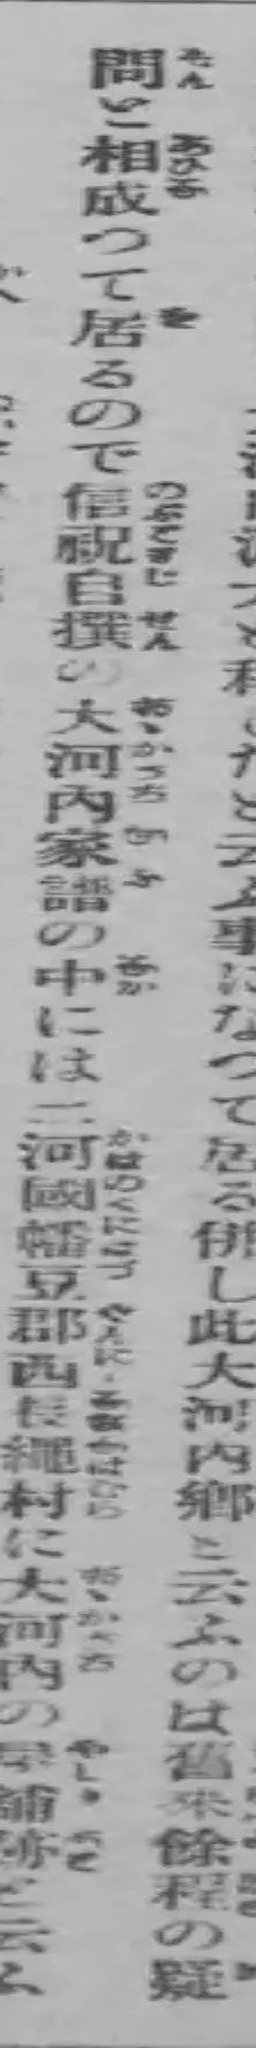問と相成つて居るので信祝自撰の大河内家譜の中には三河国幡豆郡西長縄村に大河内の家舗跡と云ふ
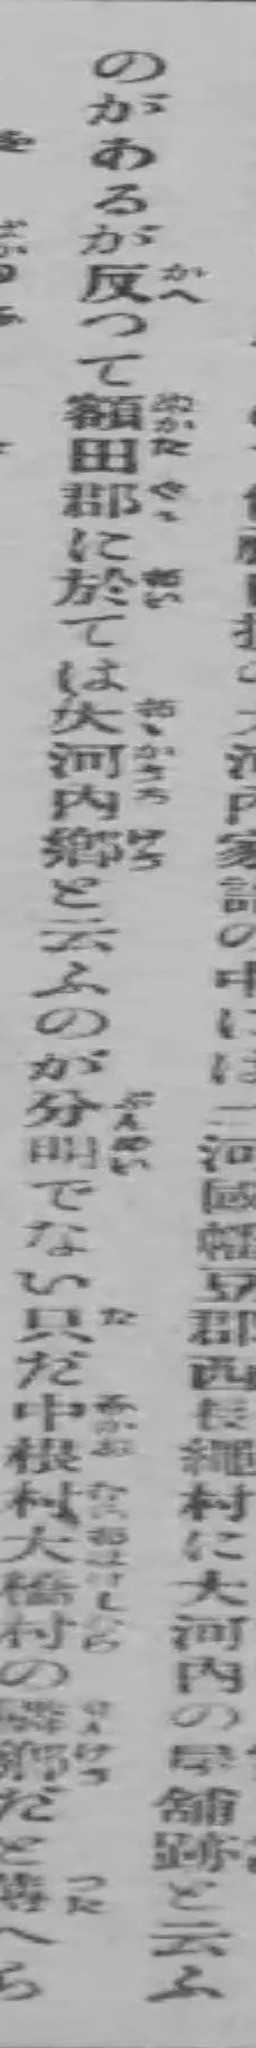のがあるが反つて額田郡に於ては大河内郷と云ふのが分明でない只だ中根村大橋村の隣郷だと伝へら
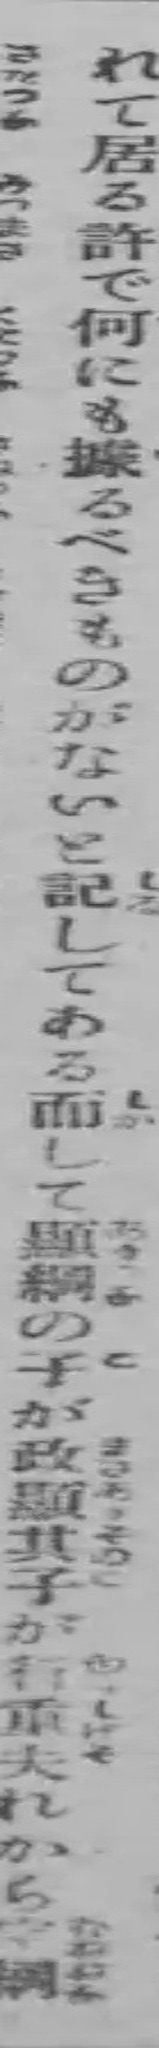れて居る許で何にも拠るべきものがないと記してある而して顕綱の子が政顕其子が行重夫れから宗綱
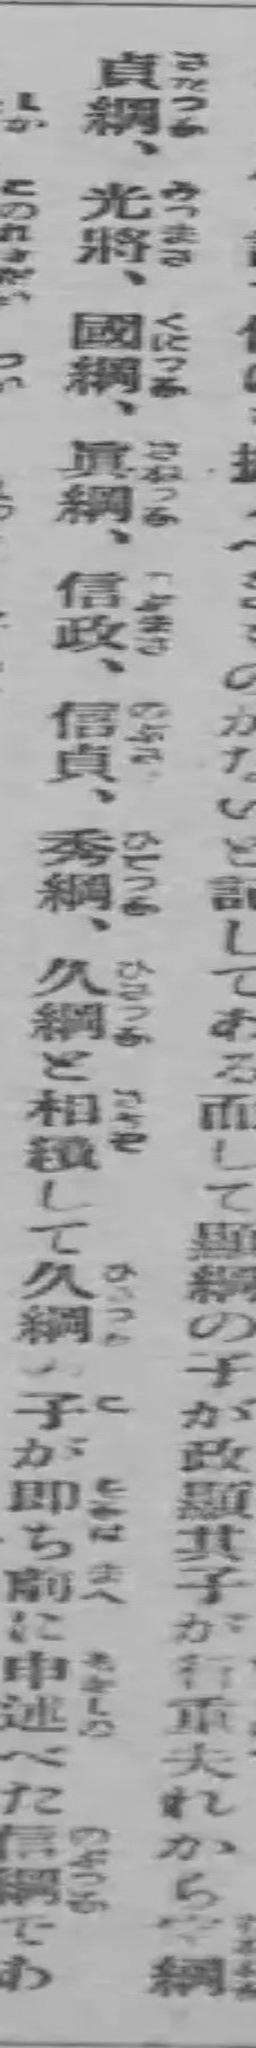貞綱、光将、国綱、眞綱、信政、信貞、秀綱、久綱と相続して久綱の子が即ち前に申述べた信綱であ
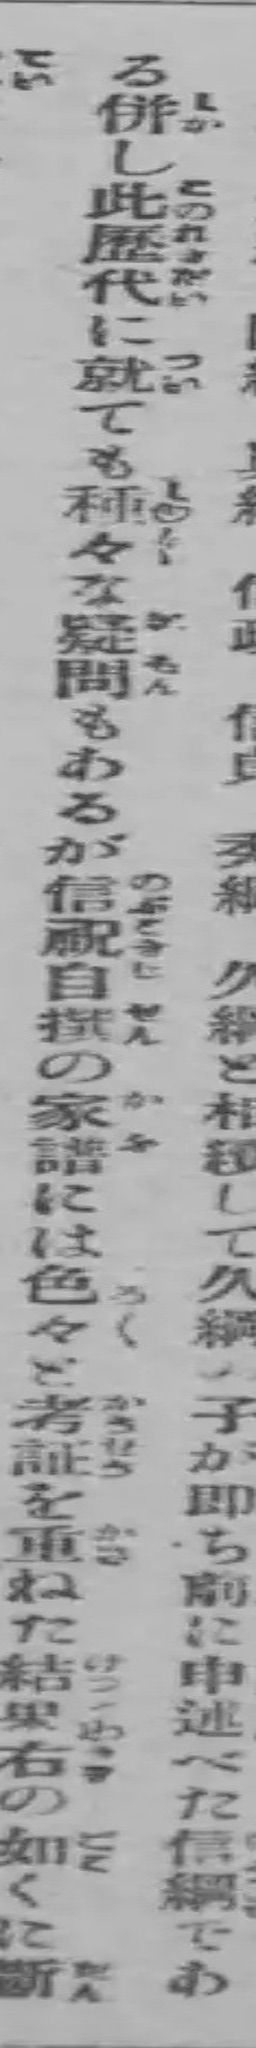る併し此歴代に就ても種々な疑問もあるが信祝自撰の家譜には色々と考証を重ねた結果右の如くに断
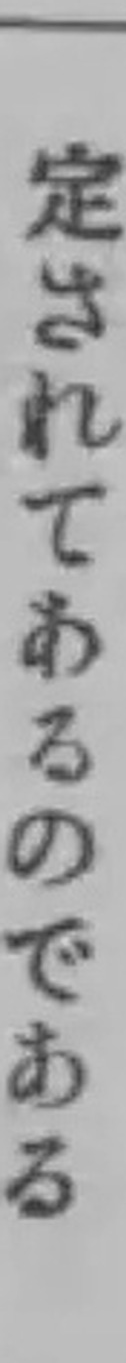定されてあるのである
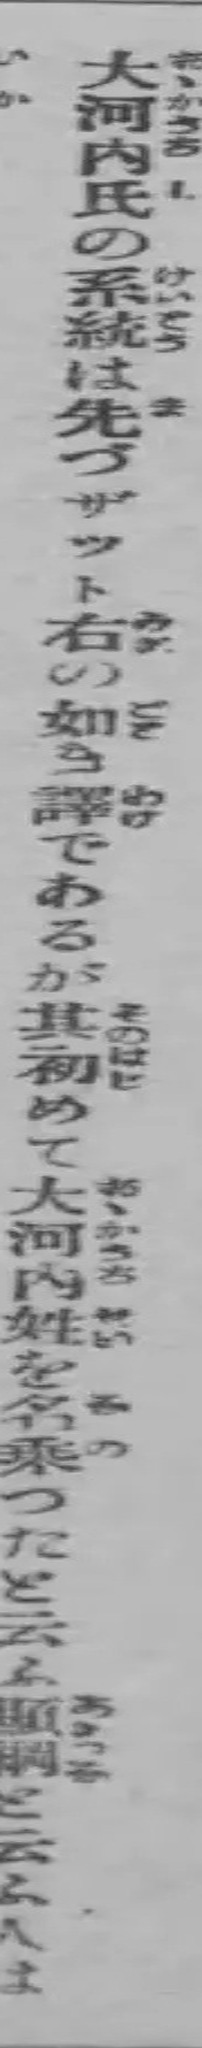大河内氏の系統は先づザツト右の如き訳であるが其初めて大河内姓を名乗つたと云ふ顕綱と云ふ人は
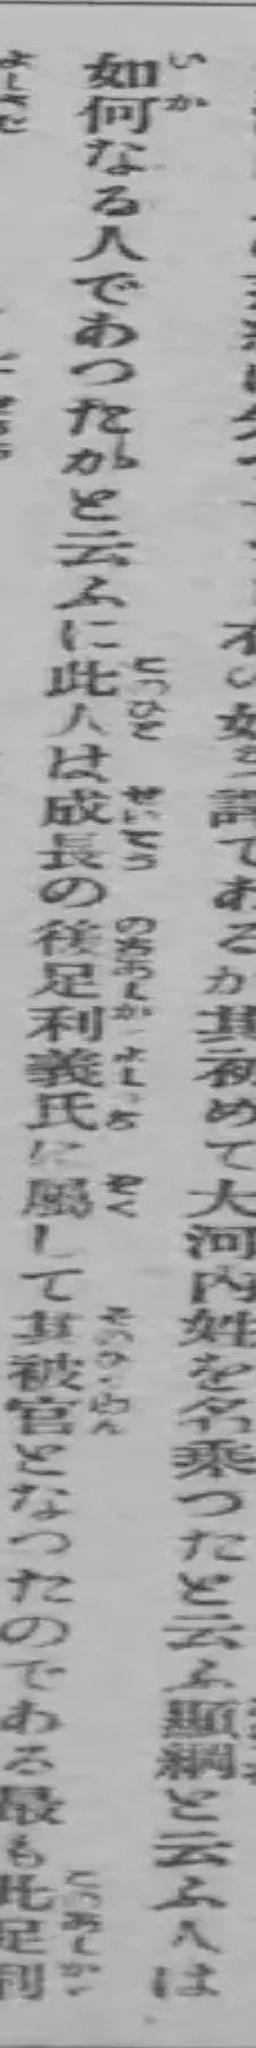如何なる人であつたかと云ふに此人は成長の後足利義氏に属して其被官となつたのである最も此足利
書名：豊橋市史談
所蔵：国立国会図書館 National Diet Library, JAPAN
